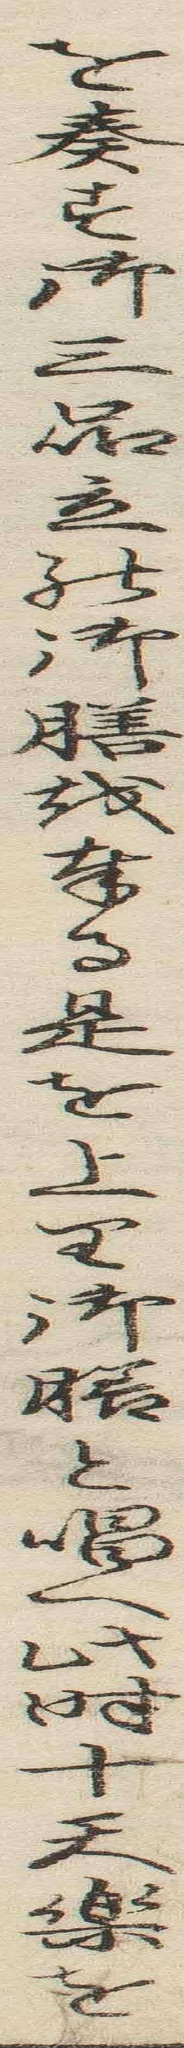を奏す御三品立の御膳を奉る是を上り御膳と唱へ此时十天樂を

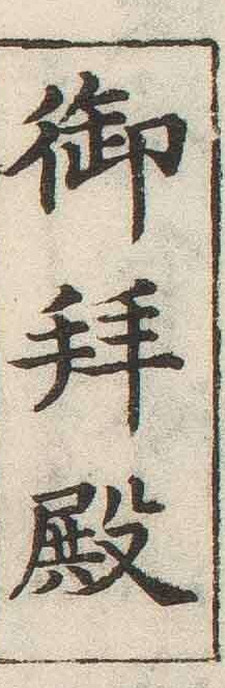御拜殿
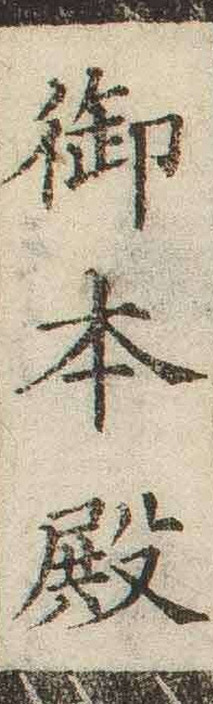御本殿

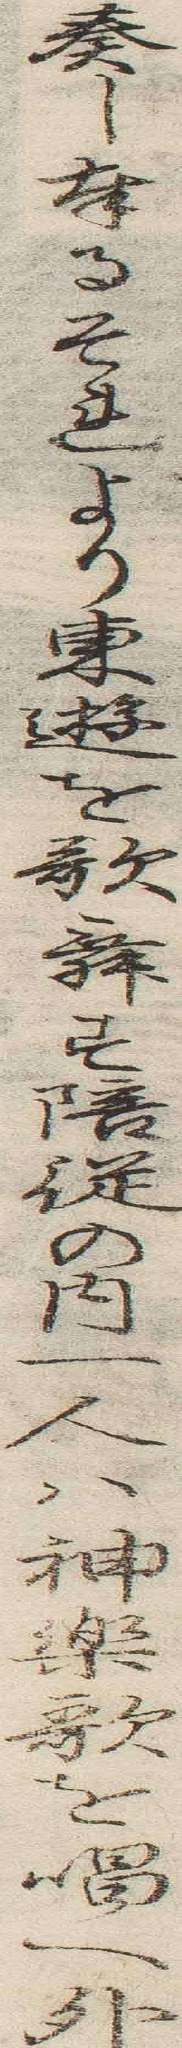奏し奉るそれより東逰を歌舞す陪従の内一人は神樂歌を唱へ外
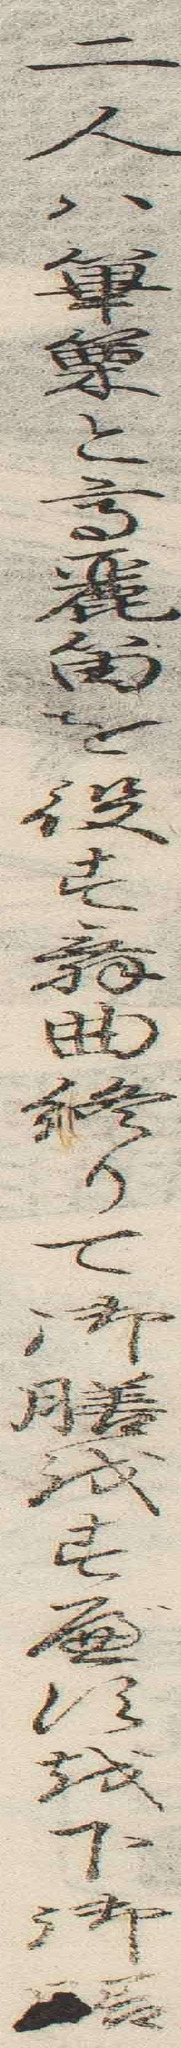二人は篳篥と高䴡笛を役す舞曲終りて御膳をすべすを下御膳
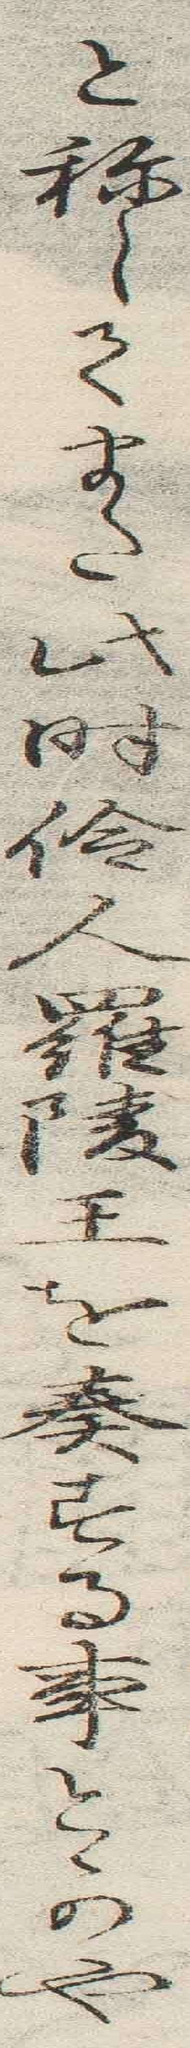と称してまた此时伶人羅陵王を奏する事とかや
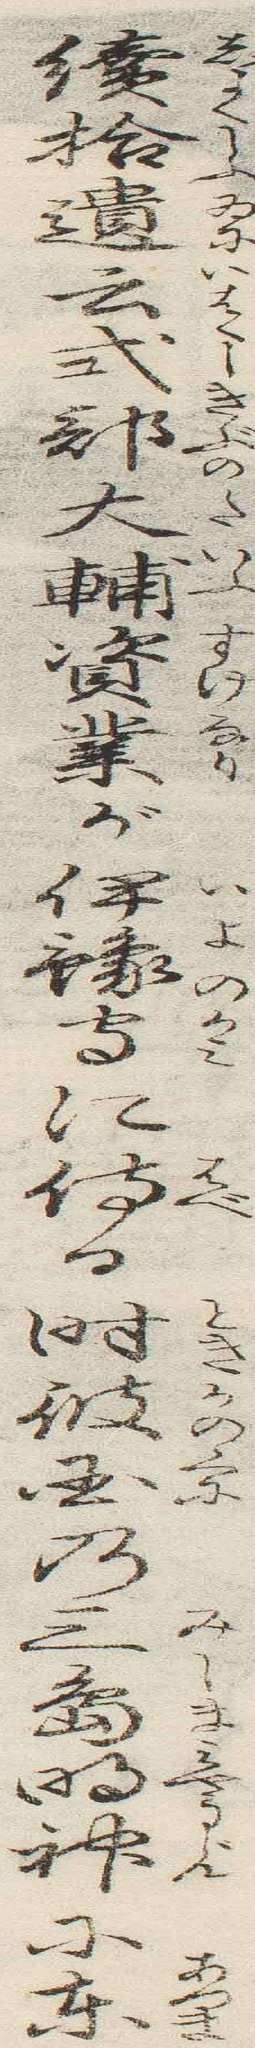續拾遺云式部大輔資業が伊豫守に侍る时彼国の三島明神に東
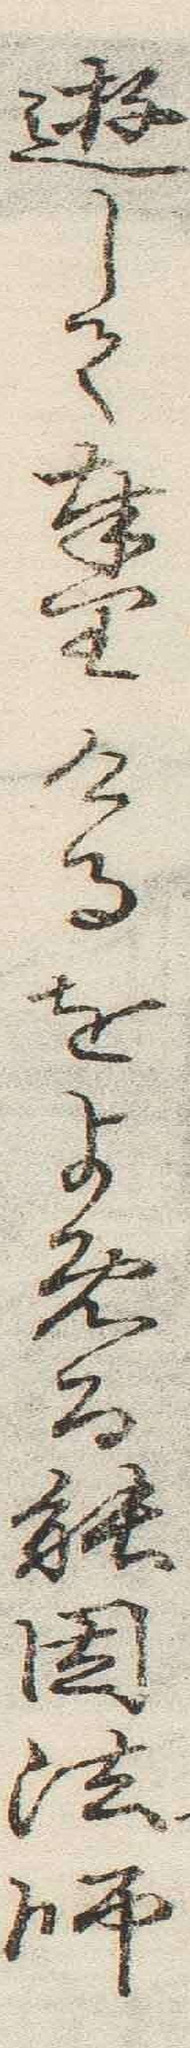逰して奉りけるをよめる能因法師
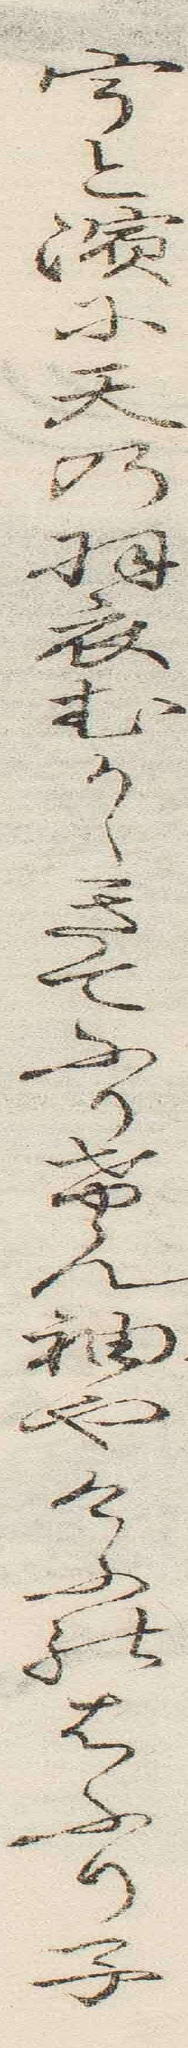宇と濵に天の羽衣むかしきてふりけん袖やけふのはふり子
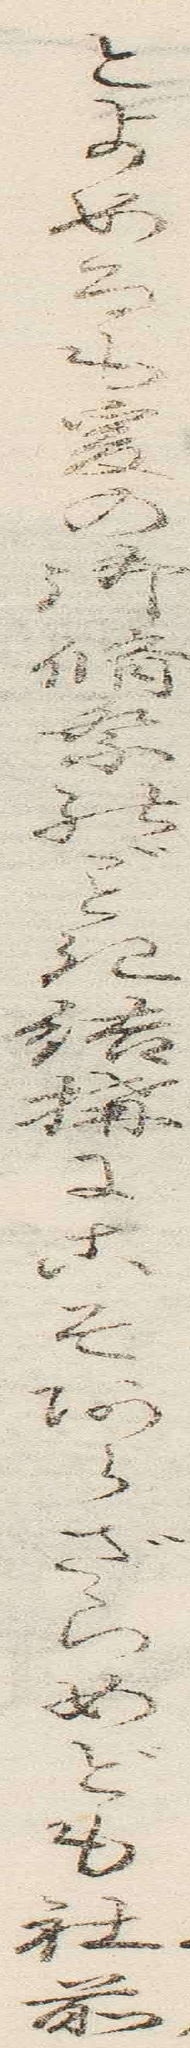とよめるも爰の御脩祭のごとき結搆にこそあらざらめども社前
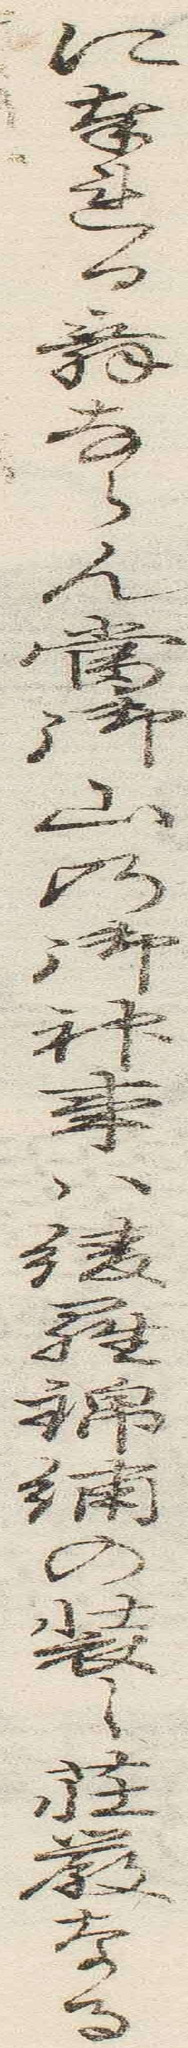に奉れる舞ならん當御山の御神事は綾羅錦繍の装し荘厳なる
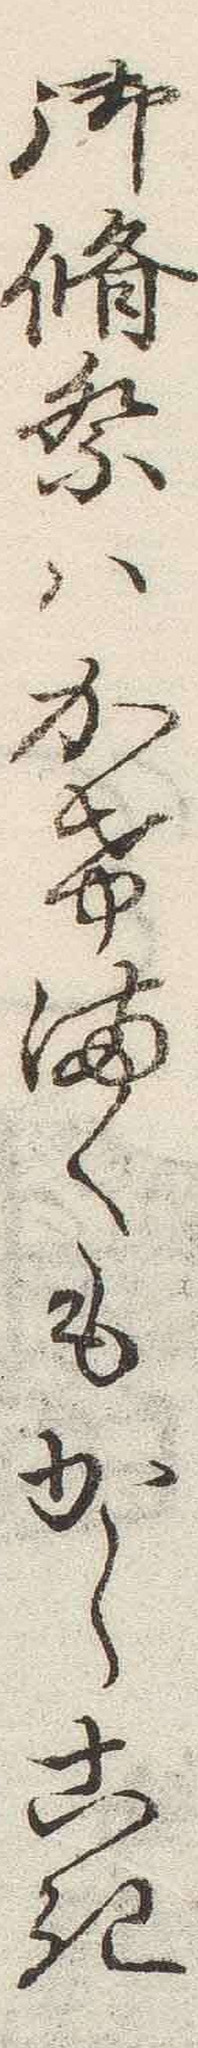御脩祭はかけまくもかしこき
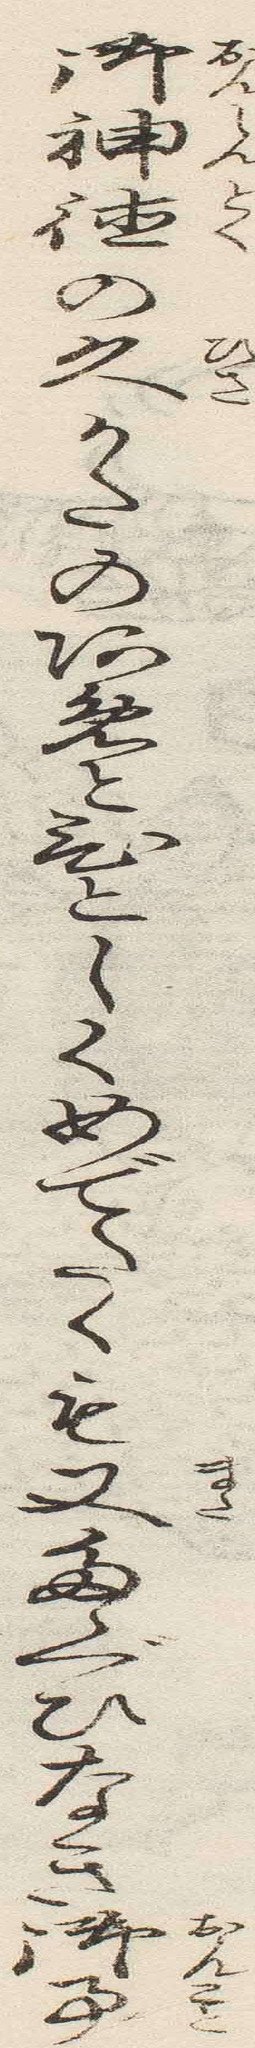御神徳の久かたのあめとひとしくめでたくも又たぐひなき御事
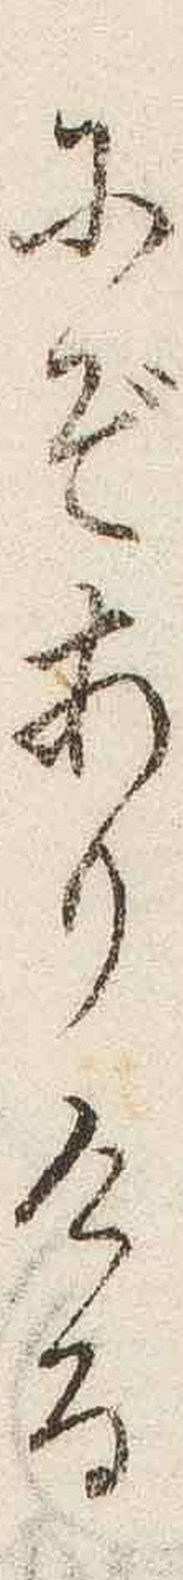にぞありける。
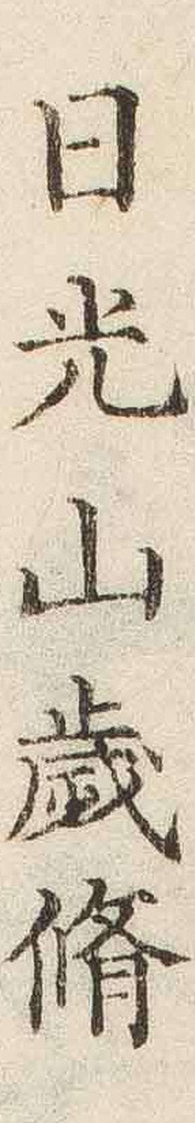日光山歲脩
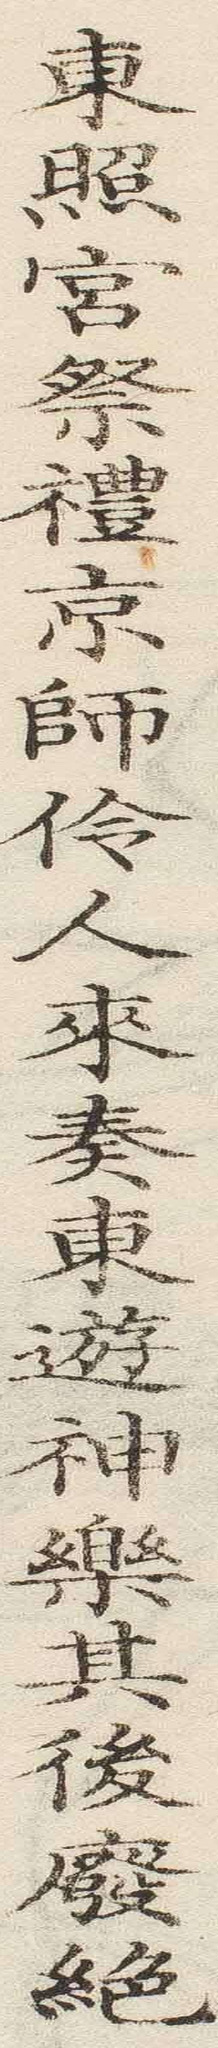東照宮祭禮京師伶人來奏東遊神樂其後廢絶
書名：日光山志
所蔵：東京学芸大学附属図書館 国文学研究資料館
